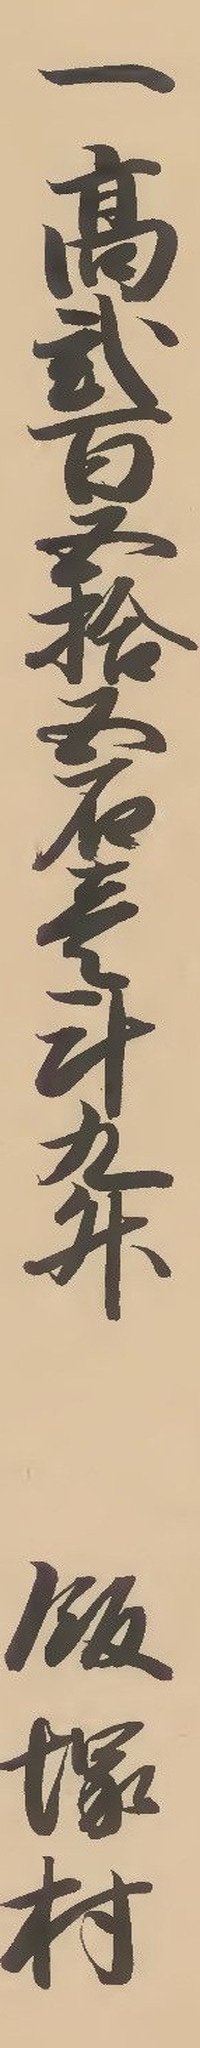一高弐百五拾五石壱斗九升飯塚村
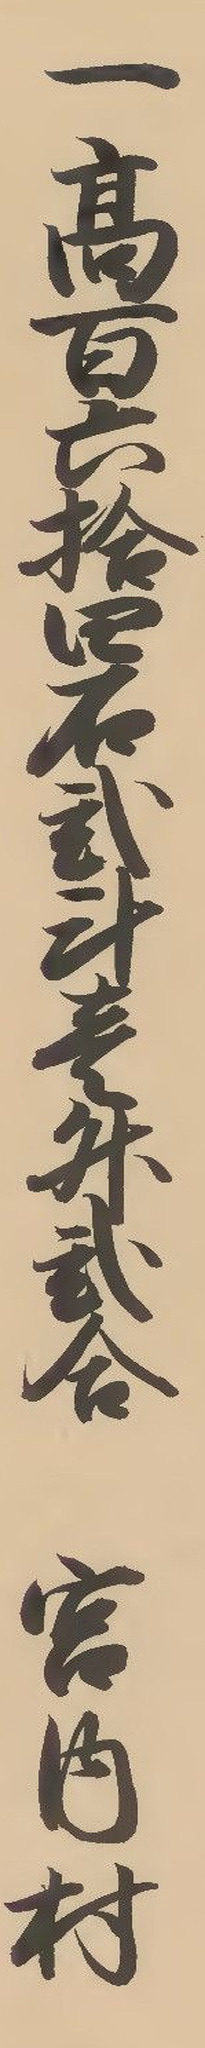一高百六拾四石弐斗壱升弐合宮内村

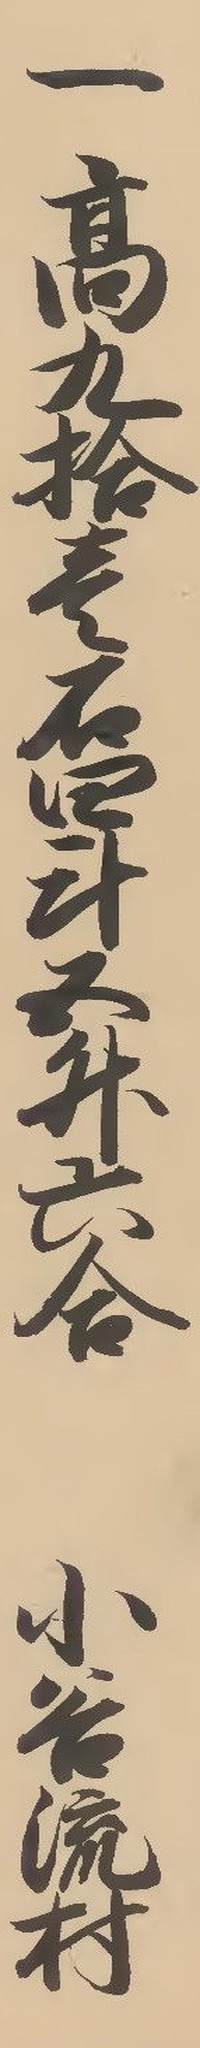一高九拾壱石四斗五升六合小谷流村
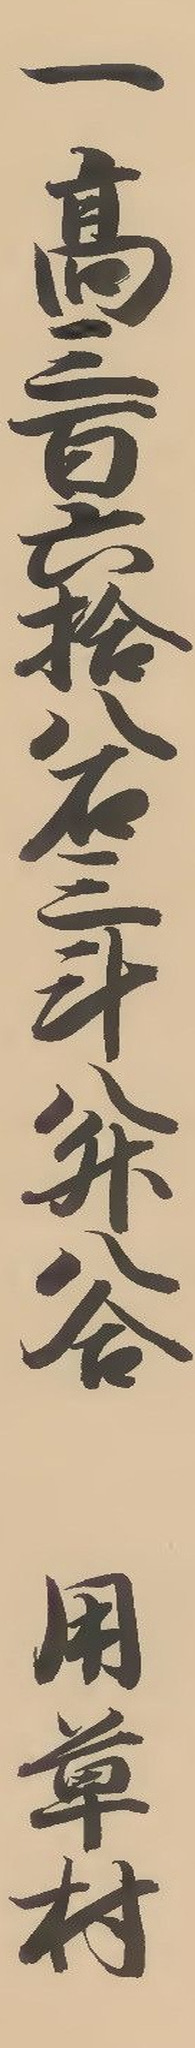一高三百六拾八石三斗八升八合用草村

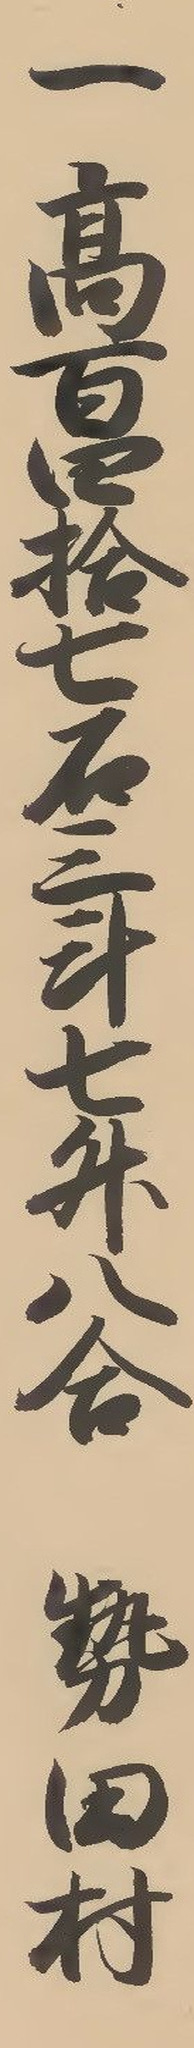一高百四拾七石三斗七升八合勢田村
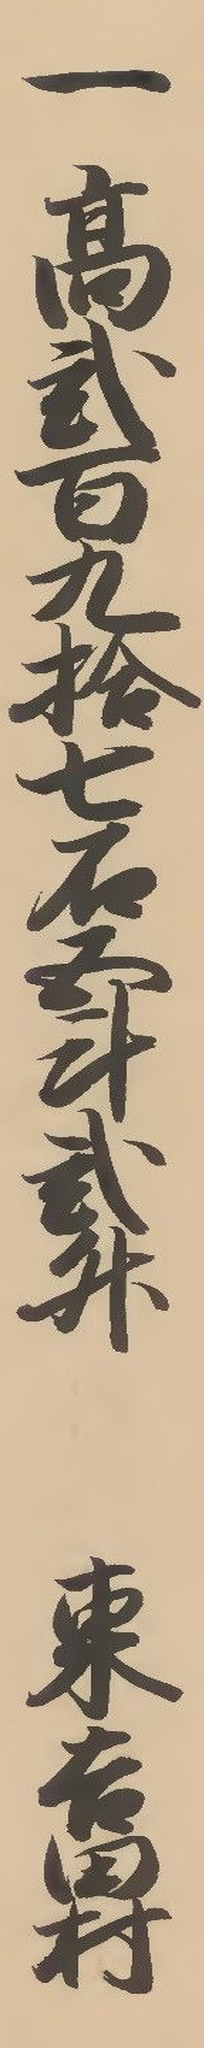一高弐百九拾七石五斗弐升東吉田村
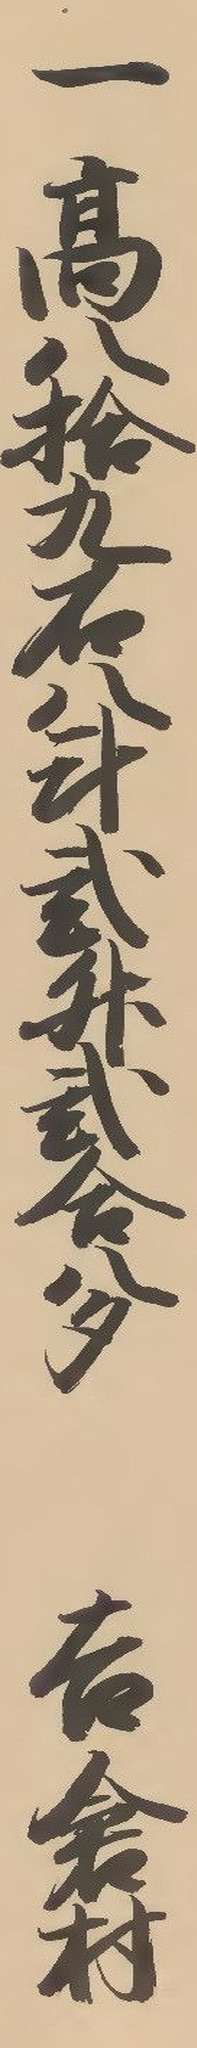一高八拾九石八斗弐升弐合八勺吉倉村
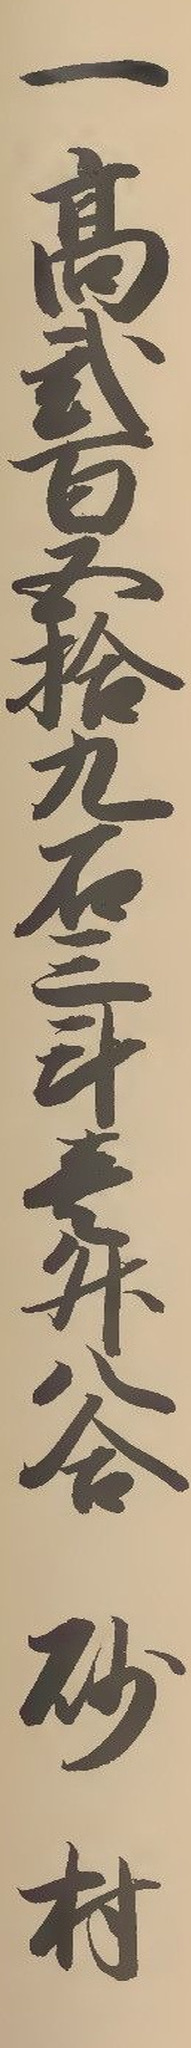一高弐百五拾九石三斗壱升八合砂村
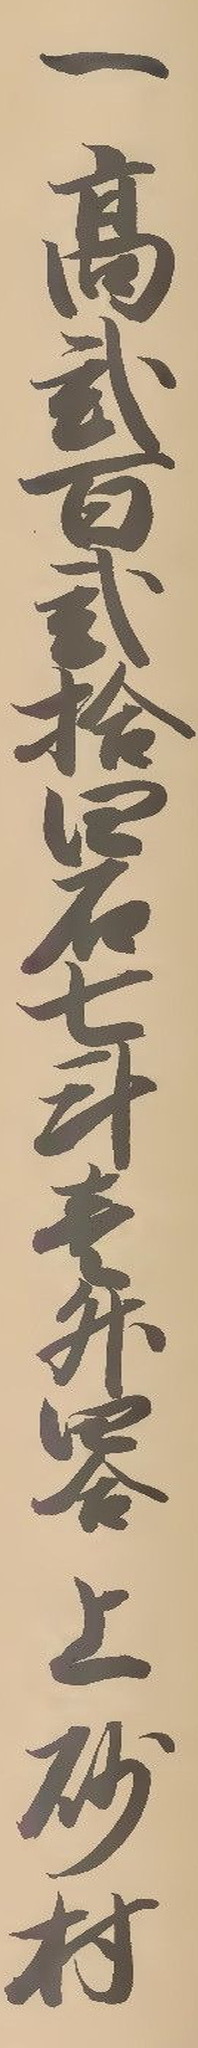一高弐百弐拾四石七斗壱升四合上砂村
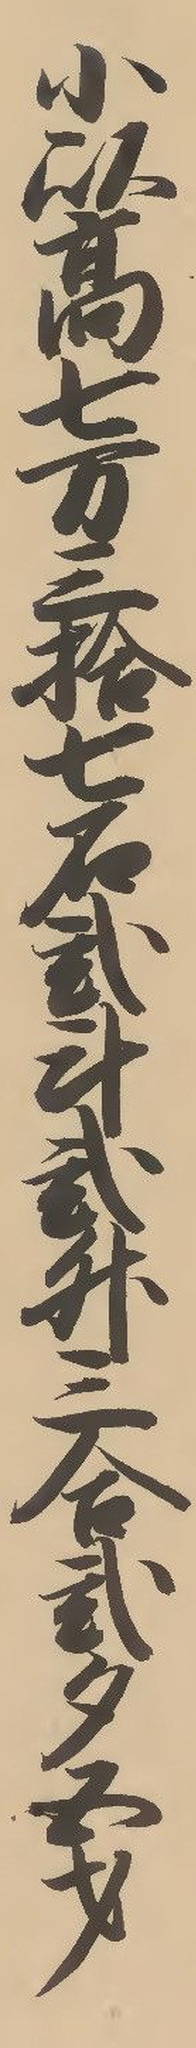小以高七万三拾七石弐斗弐升三合弐勺五才

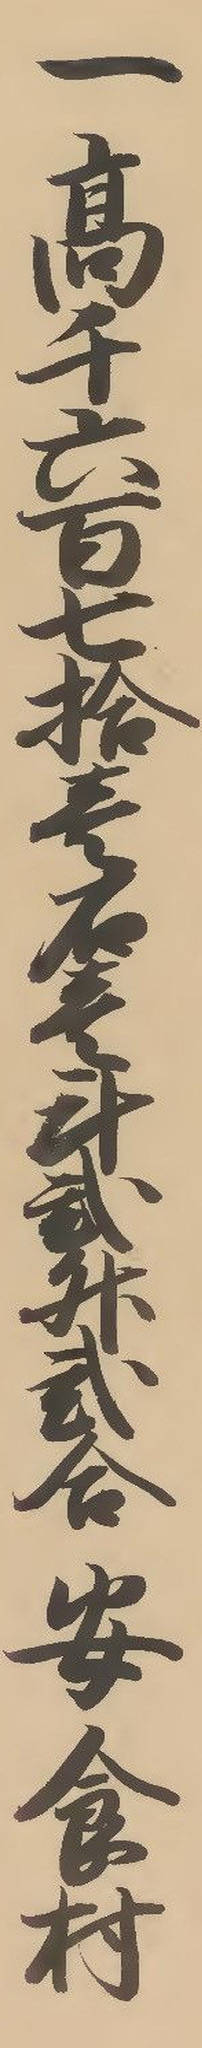一高千六百七拾壱石壱斗弐升弐合安食村
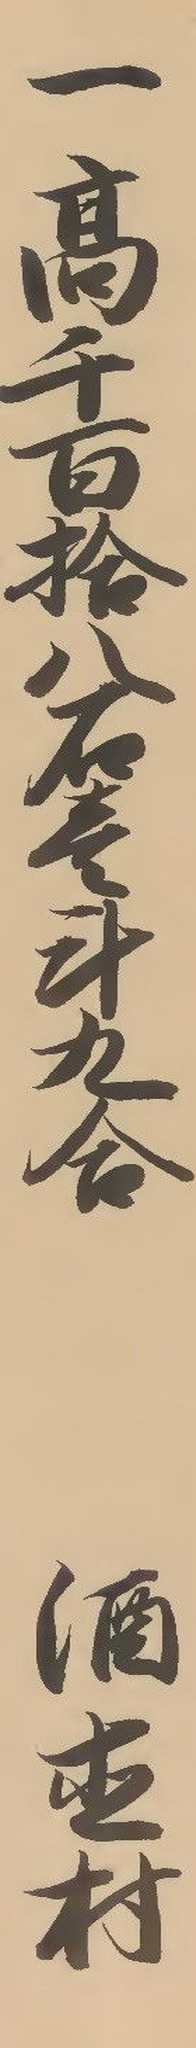一高千百拾八石壱斗九合酒直村
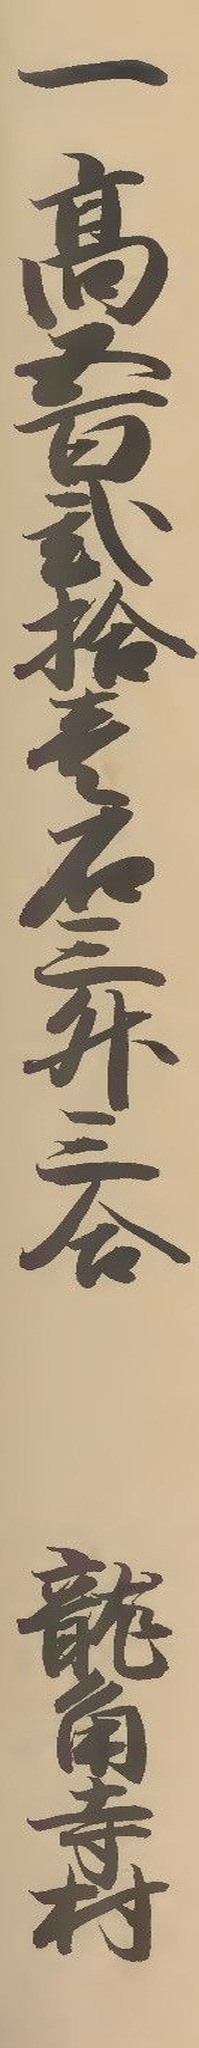一高五百弐拾壱石三升三合龍角寺村
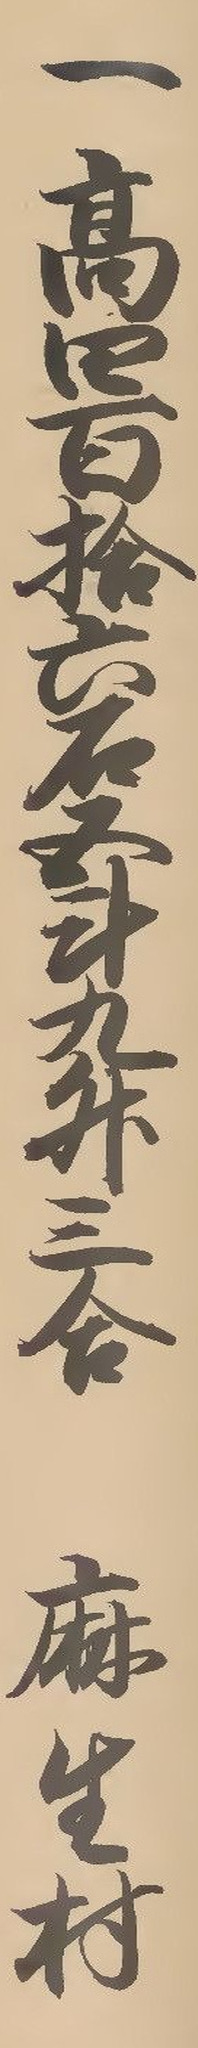一高四百拾六石五斗九升三合麻生村
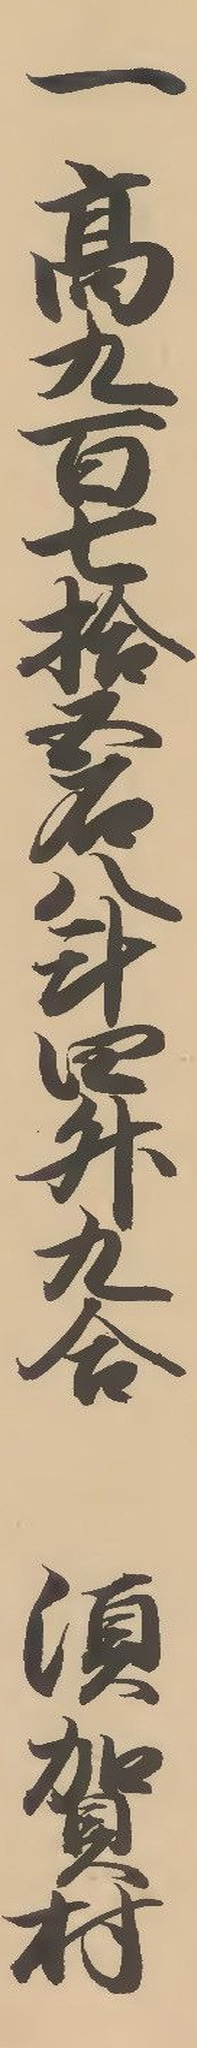一高九百七拾五石八斗四升九合須賀村
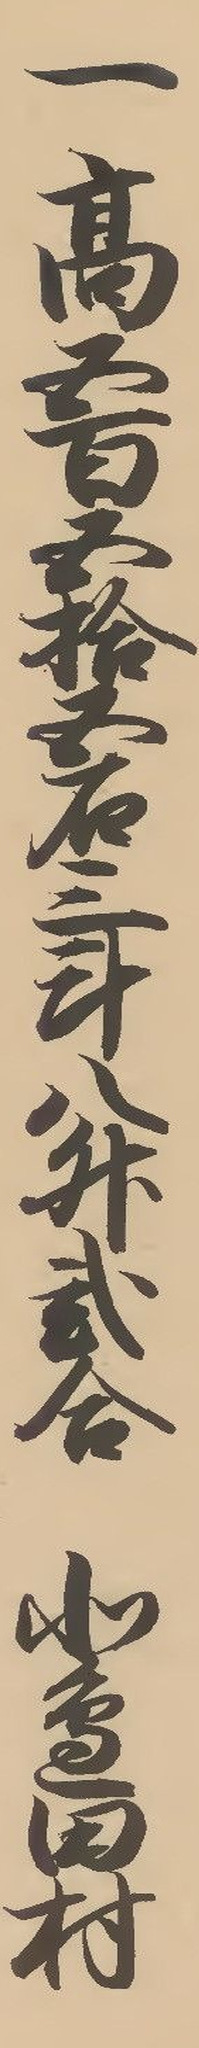一高五百五拾五右三斗八升弐合北辺田村
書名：下総国郷帳
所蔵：国立公文書館 National Archives of Japan
